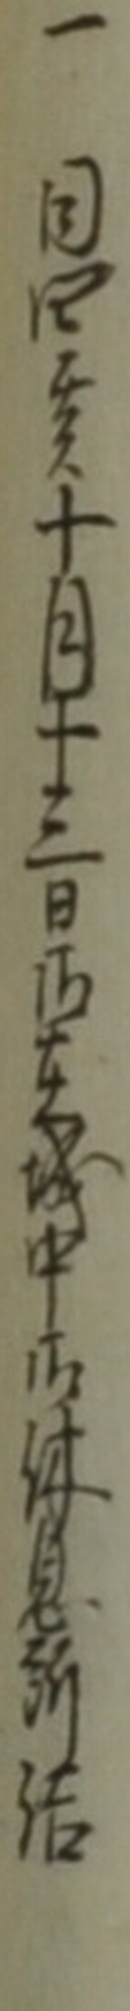一同四亥十月十三日御在城中御休息所詰
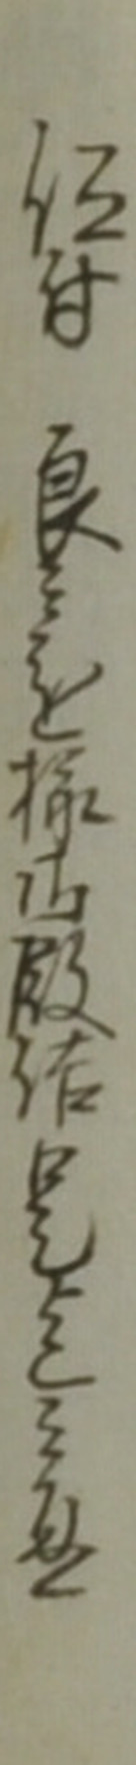仰付良之進様御殿詰是迄之通
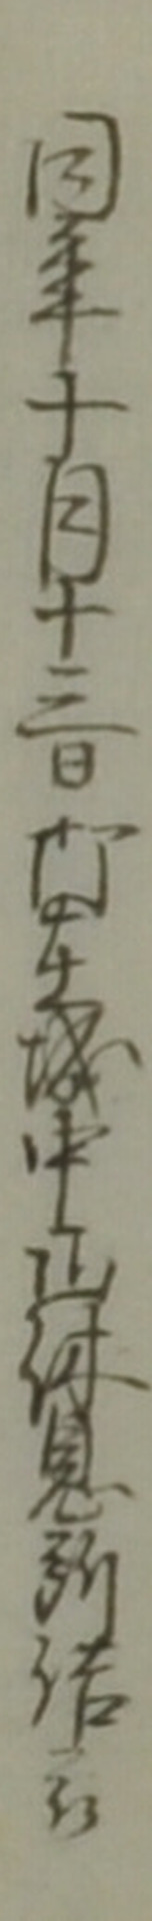一同年十月十三日御在城中御休息所詰被
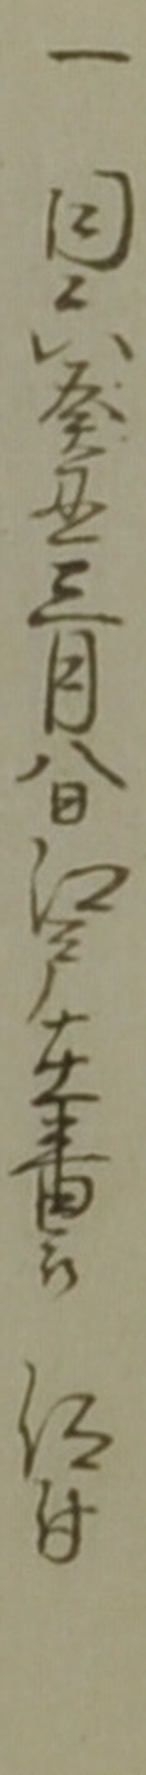一同六癸丑三月八日江戸在番被仰付
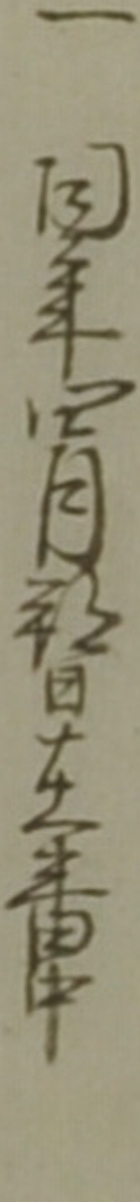一同年四月朔日在番中
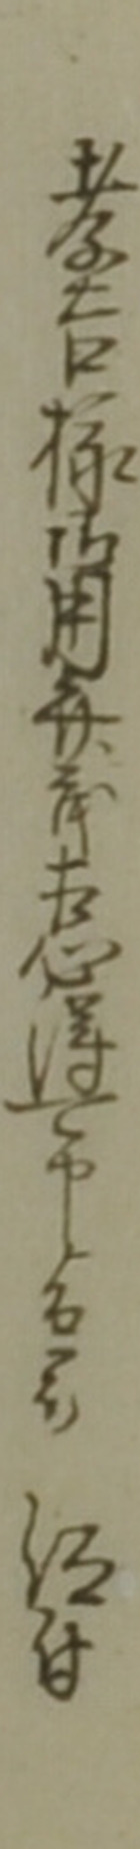孝吉様御用弁茂相心得可申旨被仰付

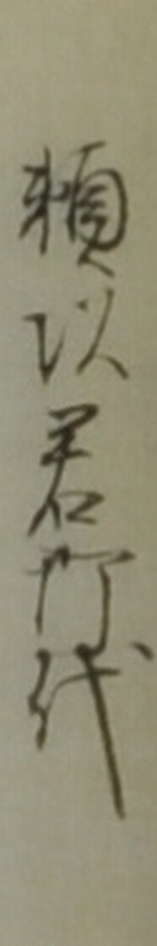頼以君御代
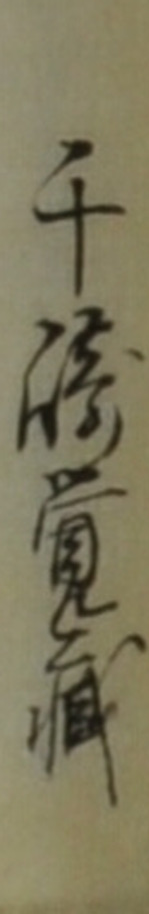千崎覚蔵
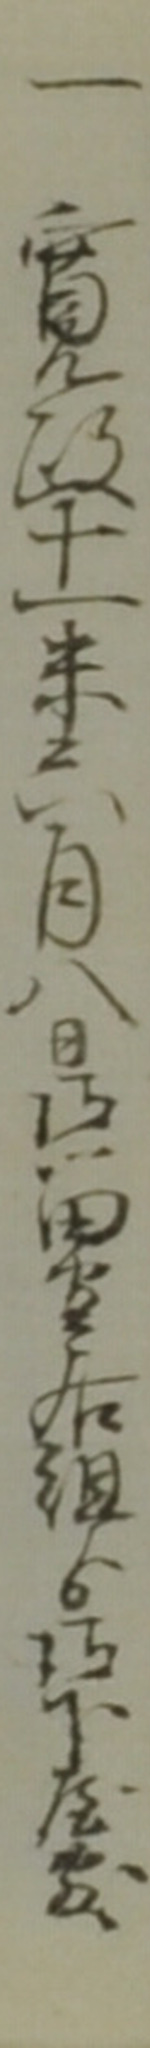一寛政十一未六月八日御留守居組ゟ御下屋敷
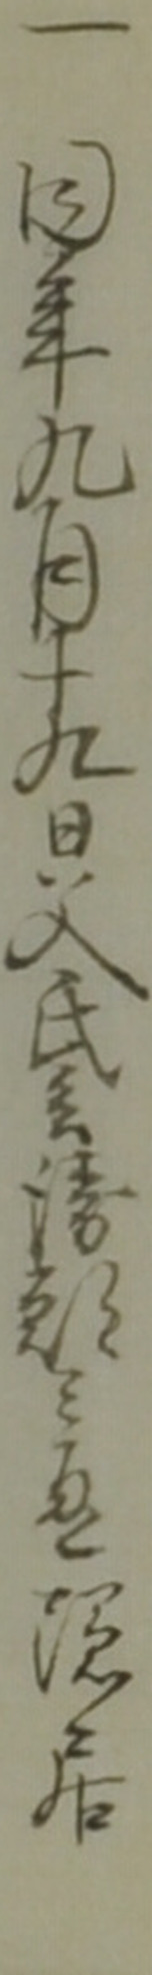一同年九月十九日父氏兵衛願之通隠居
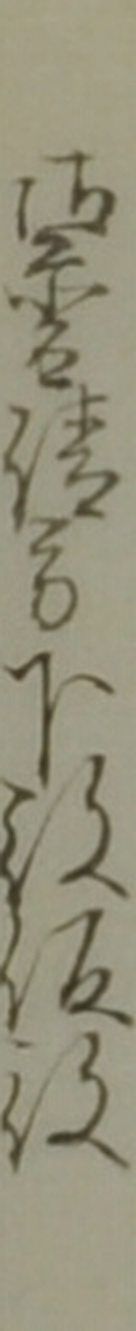御普請方下役仮役
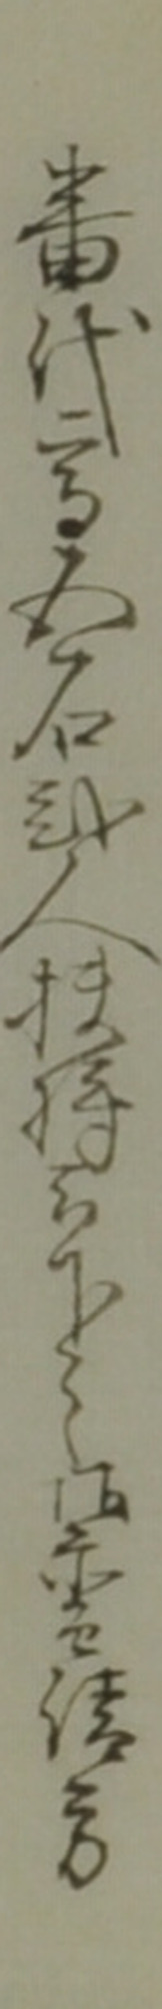番代高五石弐人扶持被下之御普請方
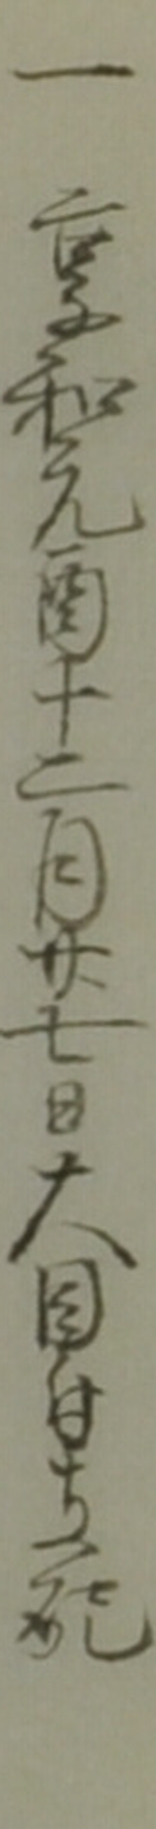一享和元酉十二月廿七日大目付支配
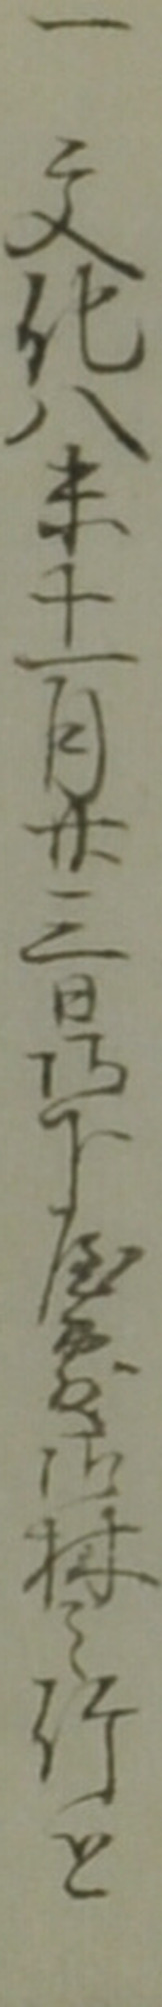一文化八未十一月廿三日御下屋敷御林之竹と
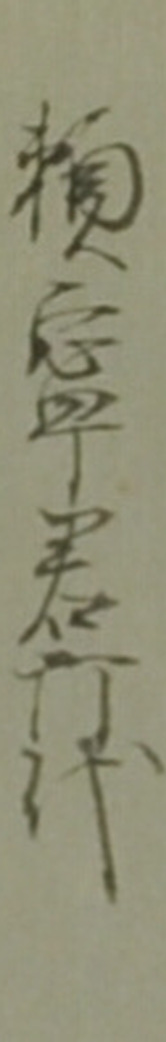頼以君御代
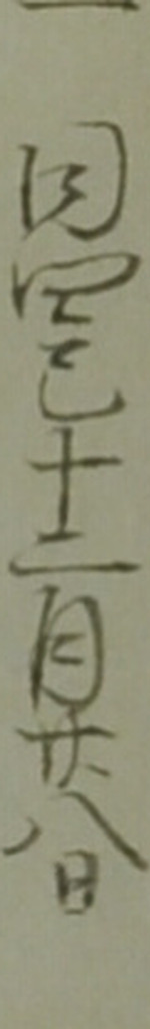一同四巳十二月廿八日
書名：無足諸士勤仕録（八）
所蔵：伊那市立高遠町図書館・合同会社AMANE
